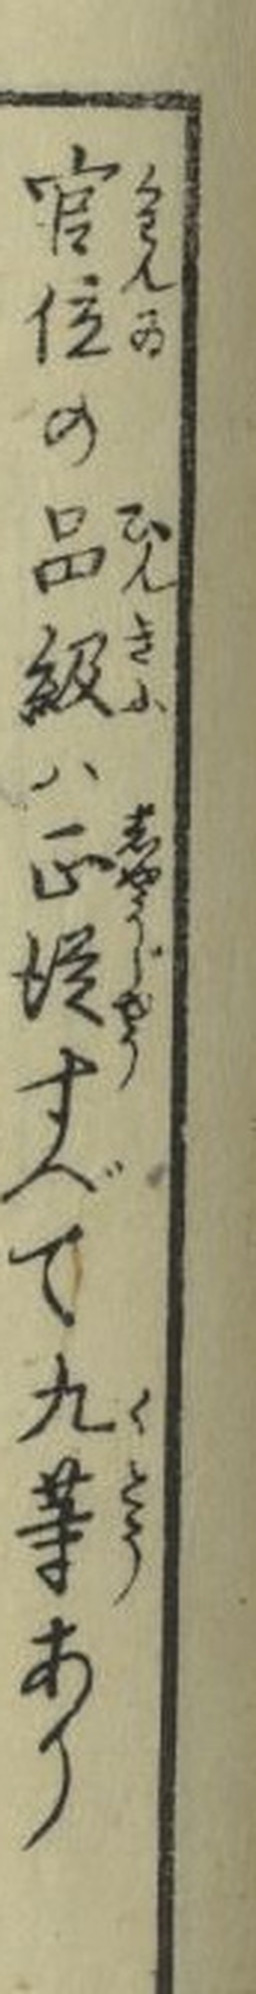官位の品級は正従すべて九等あり
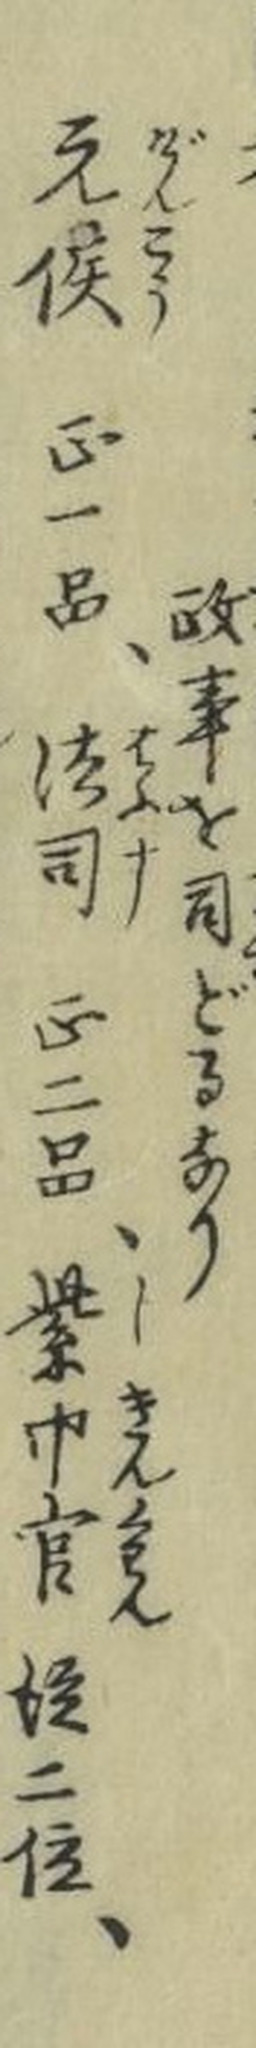元侯正一品、法司正二品、紫巾官従二位、
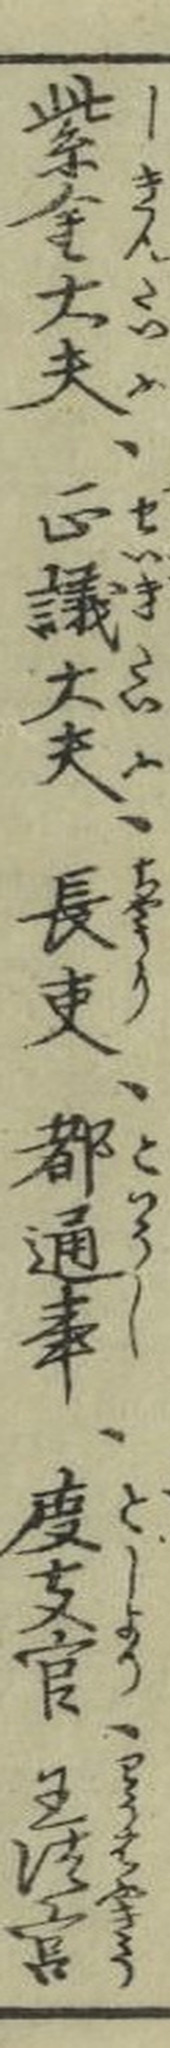紫金大夫、正議大夫、長吏、都通奉、度支官、王法宮

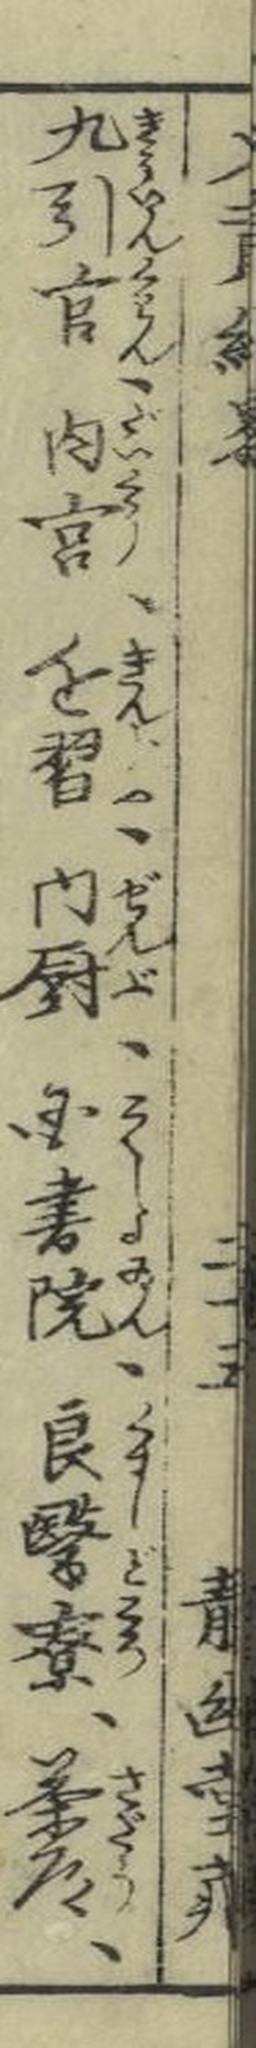九引官、内官、近習、内厨、国書院、良医寮、茶道、
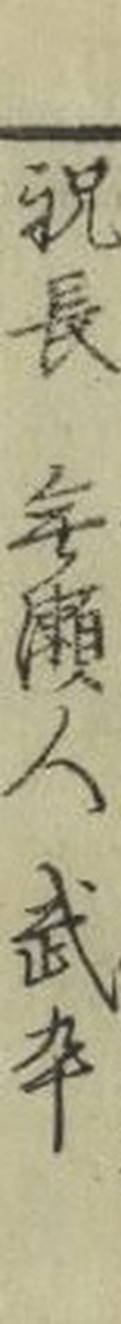祝長、無瀬人、武卒、
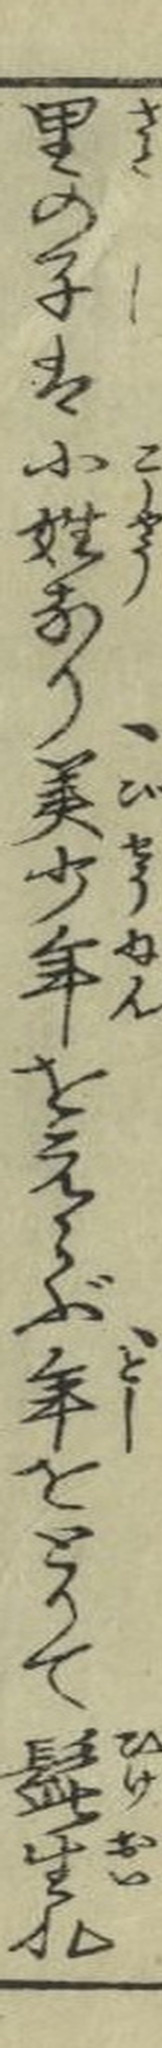里の子は小姓なり、美少年をえらぶ、年をとりて髭生れ
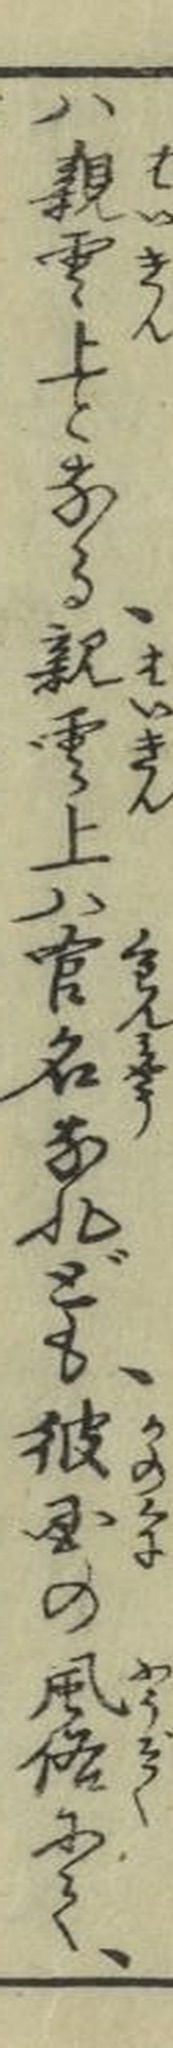は親雲上となる、親雲上は官名なれども、彼国の風俗にて、
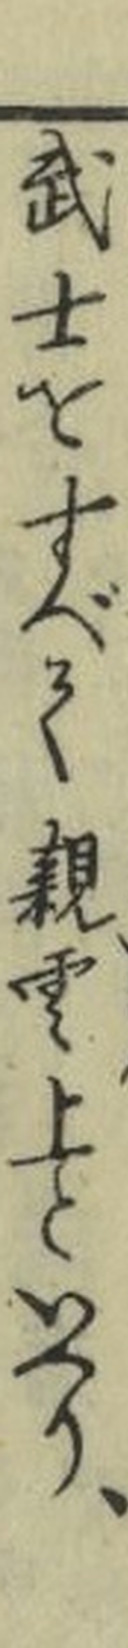武士をすべて親雲上といへり、
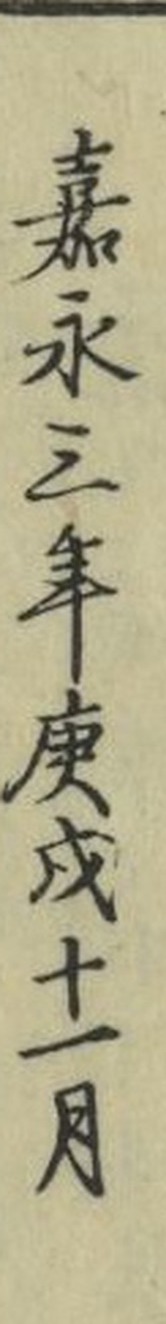嘉永三年庚戌十一月
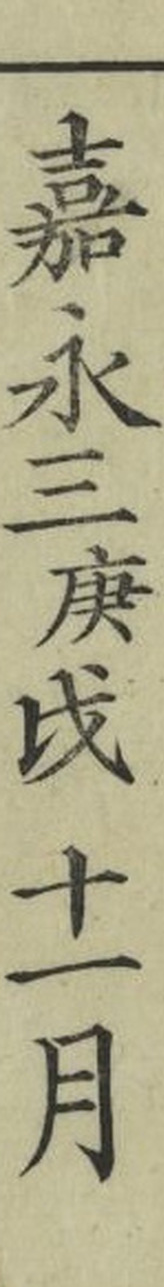嘉永三年庚戌十一月
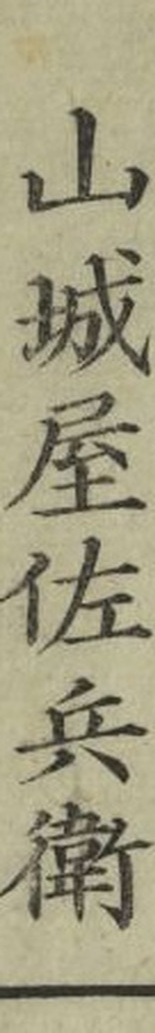山城屋佐兵衛
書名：琉球入貢紀略
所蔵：University of the Ryukyus Library
